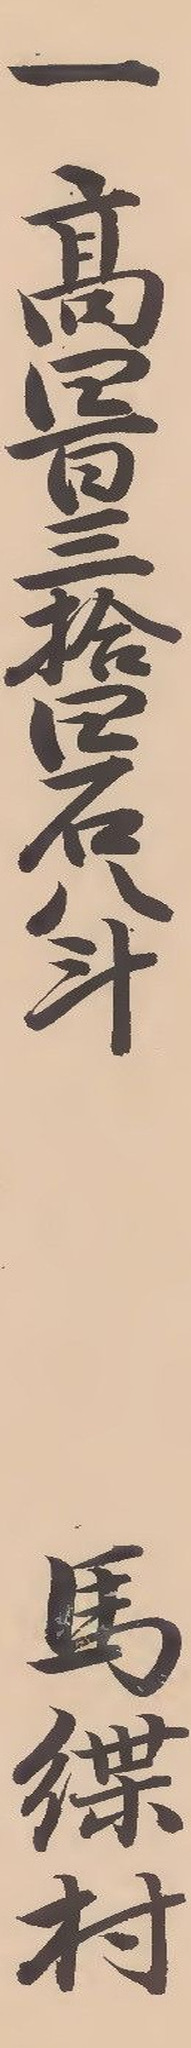一高四百三拾四石八斗馬緤村
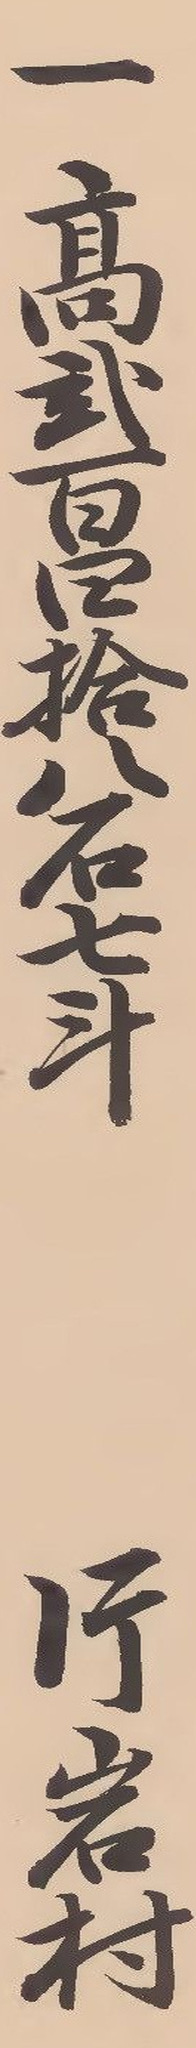一高弐百四拾八石七斗片岩村
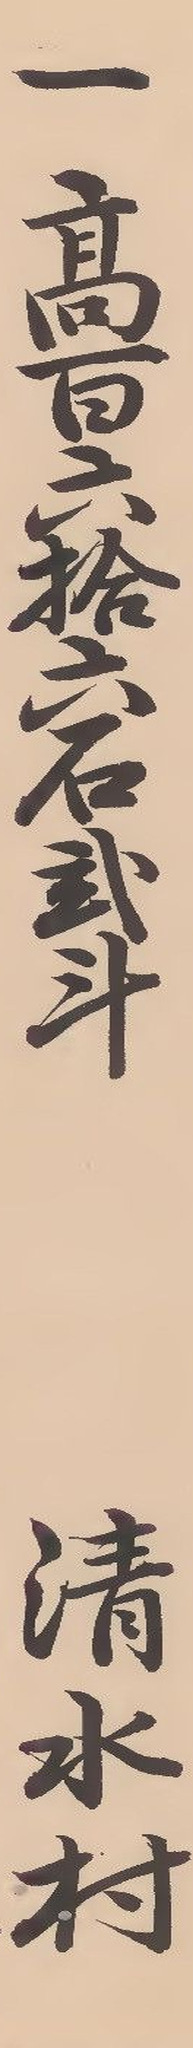一高百六拾六石弐斗清水村
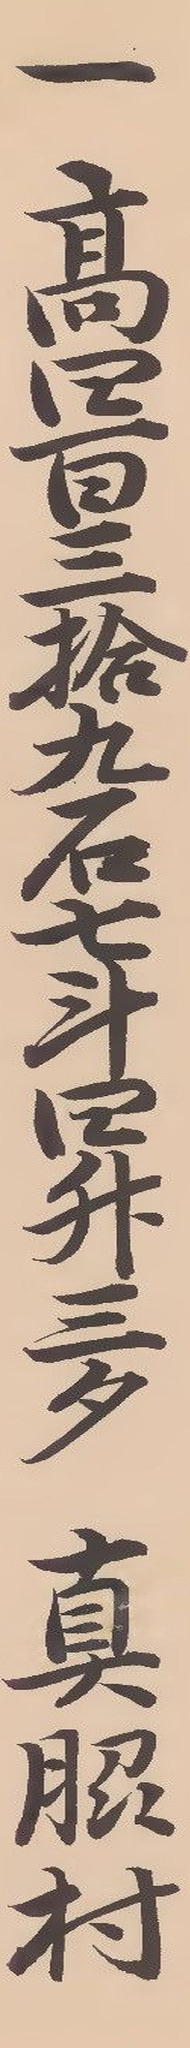一高四百三拾九石七斗四升三勺真脇村

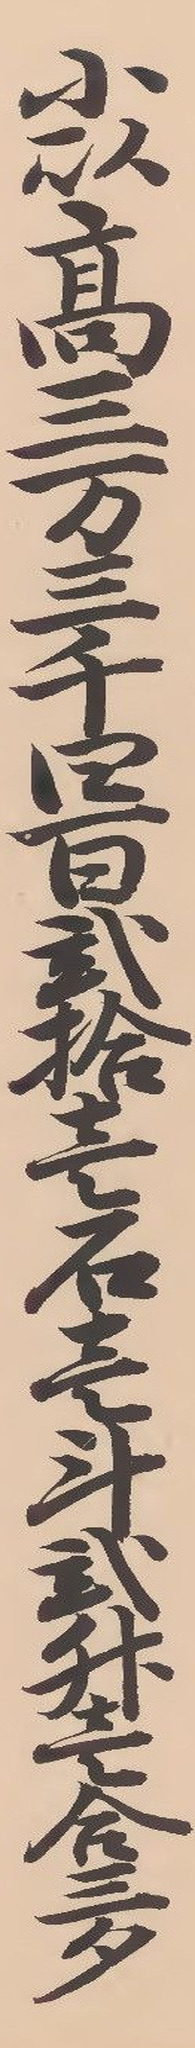小以高三万三千四百弐拾壱石壱斗弐升壱合三勺
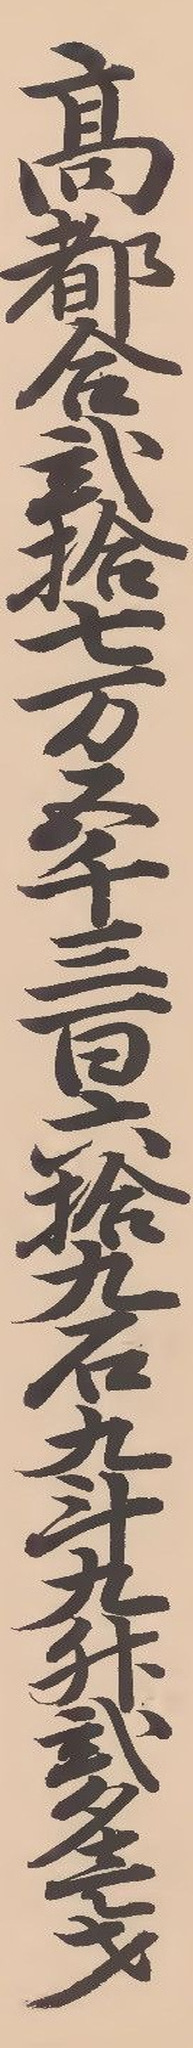高都合弐拾七万五千三百六拾九石九斗九升弐勺壱才
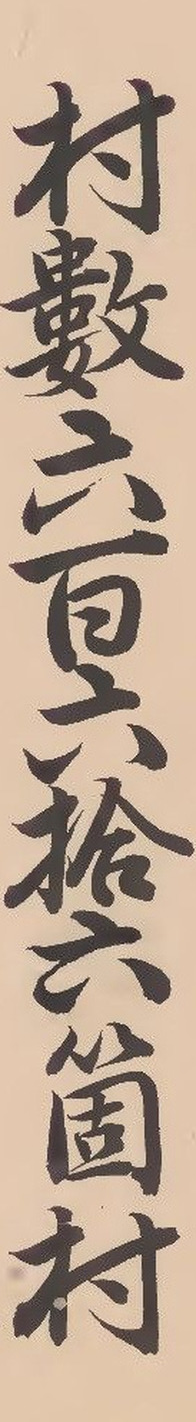村数六百六拾六箇村
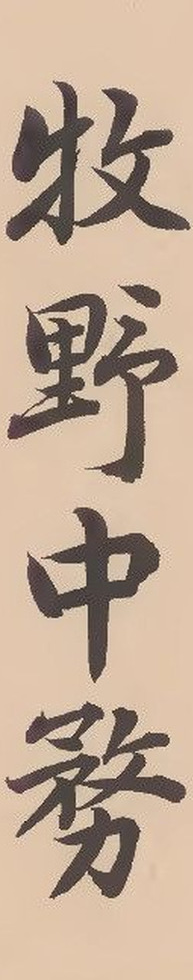牧野中務
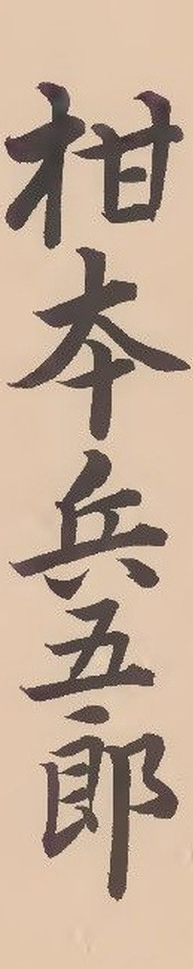柑本兵五郎
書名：能登国郷帳
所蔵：国立公文書館 National Archives of Japan
